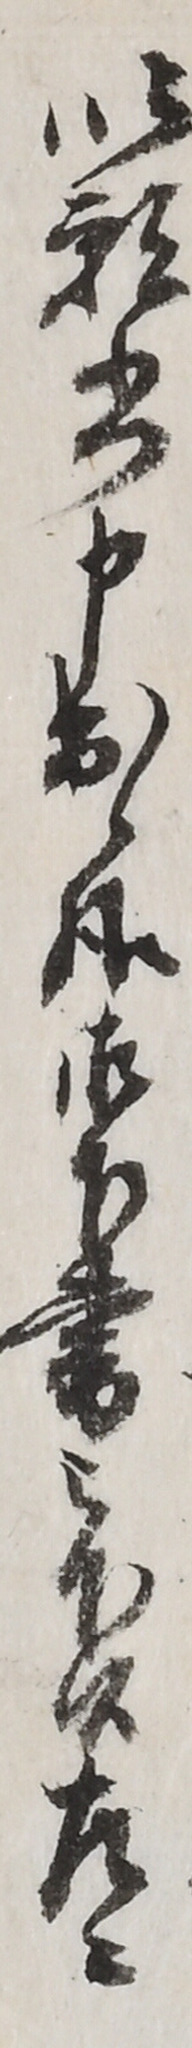以願書申出候様御下書被下候左ニ
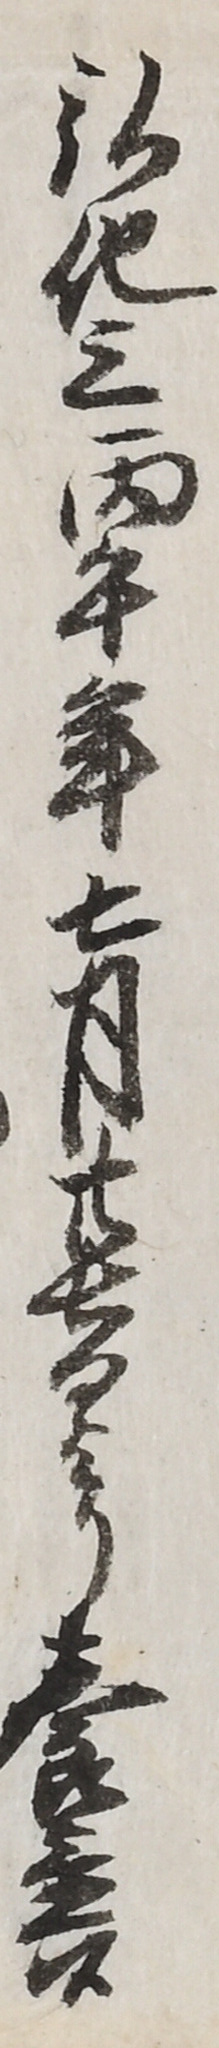弘化三丙午年七月廿七日より養置候
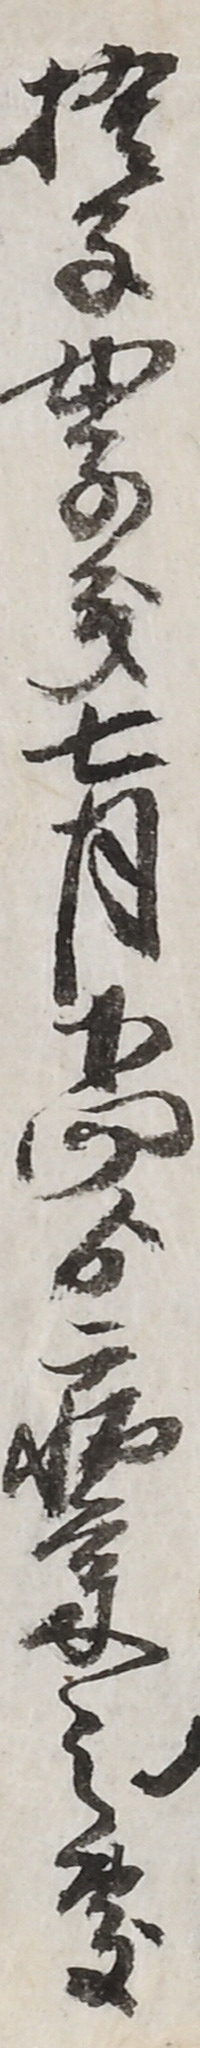捨子女子義七月下旬より病気之処
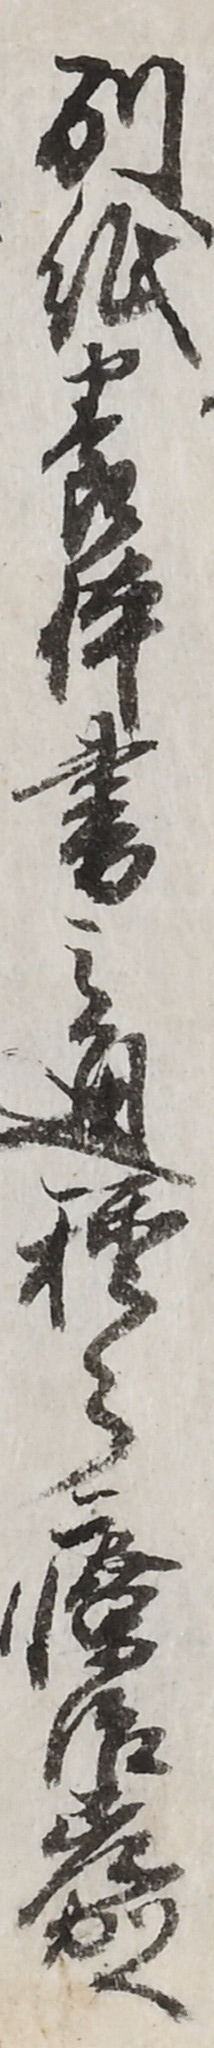別紙養体書之通捨子療養差加へ
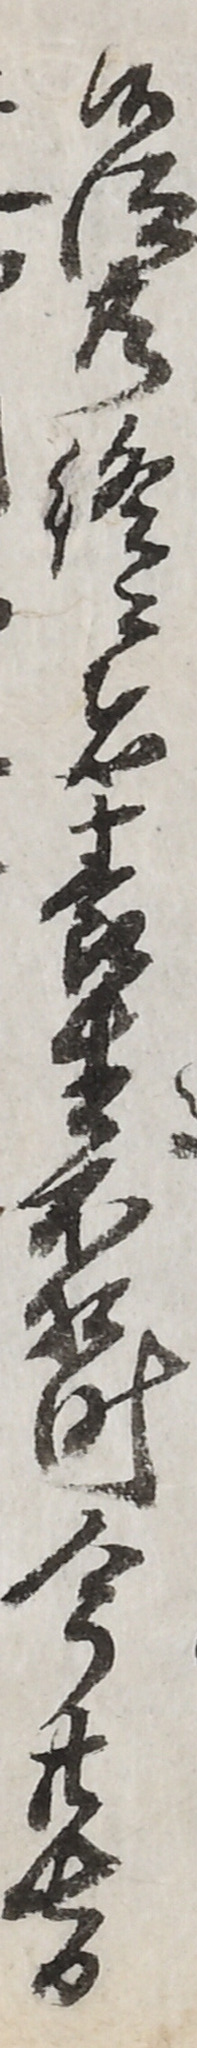候得共終ニは養生不相叶今廿七日
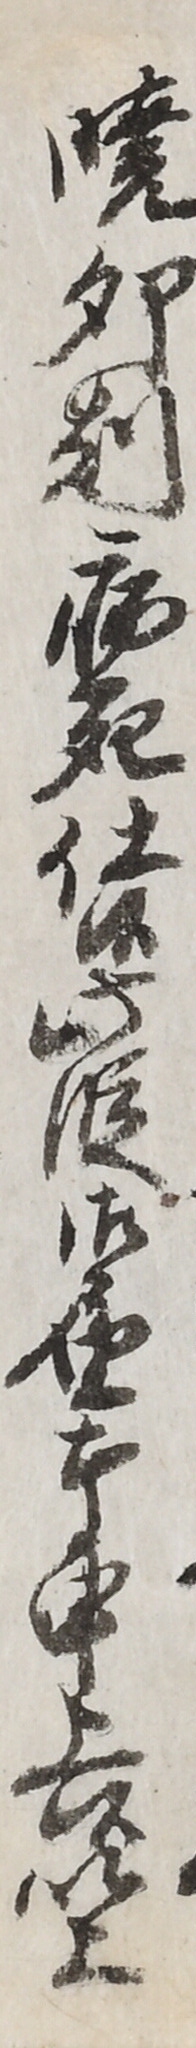暁卯刻病死仕候此段御届申上候以上
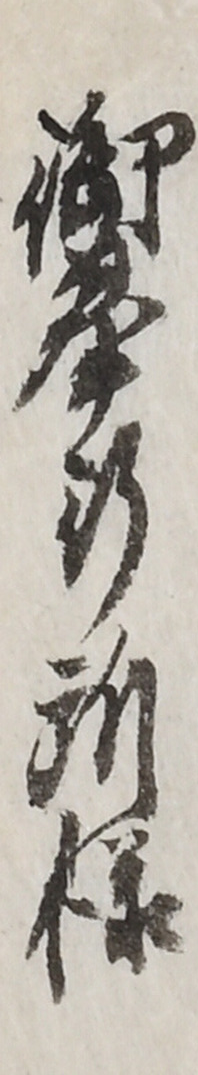御奉行所様
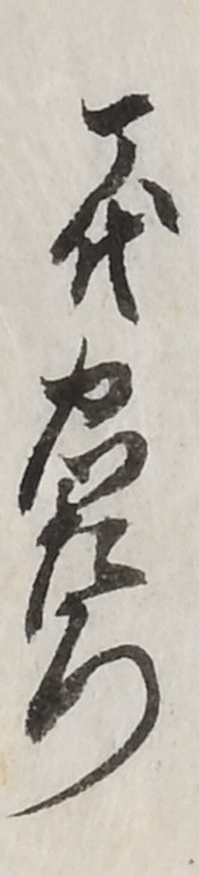丁代忠左衛門

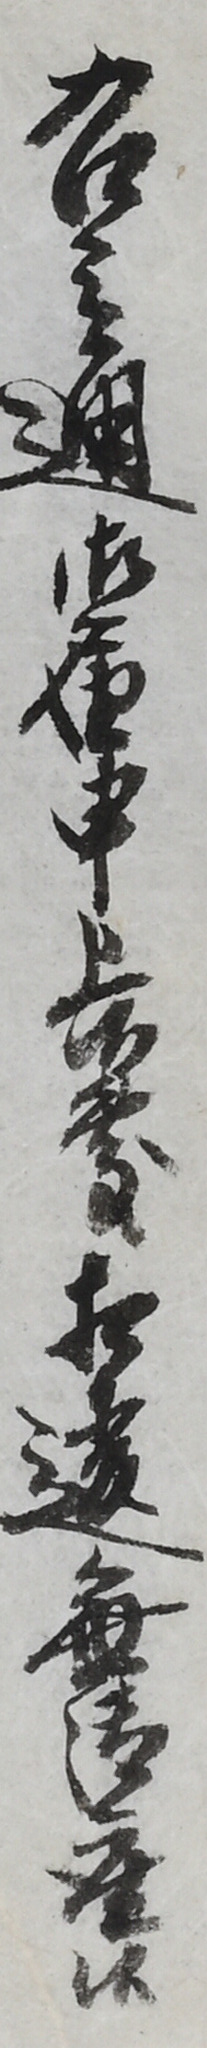右之通御届申上候処相違無御座候
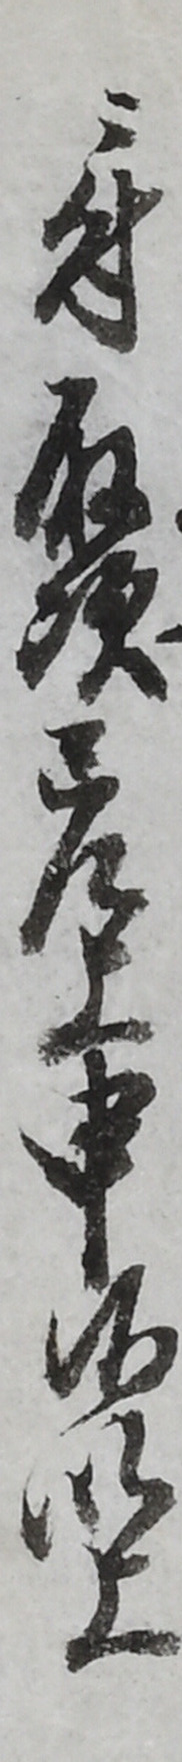ニ付取次差上申候以上
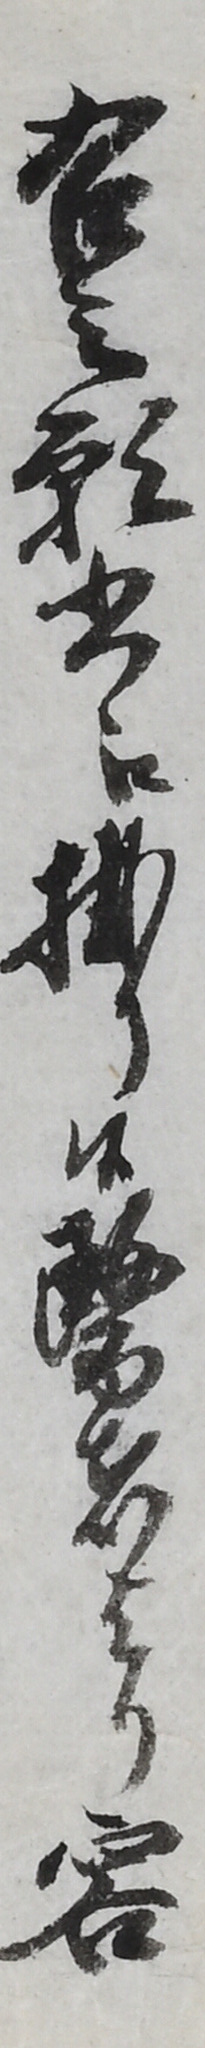右之願出江掛り候医者より容
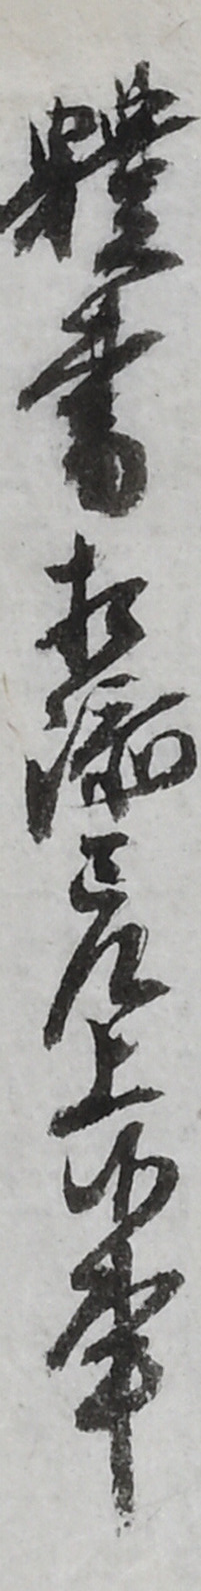体書相添差上候事

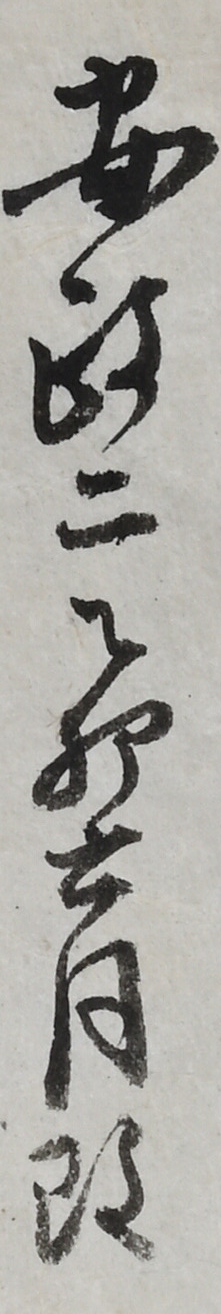安政二乙卯六月改
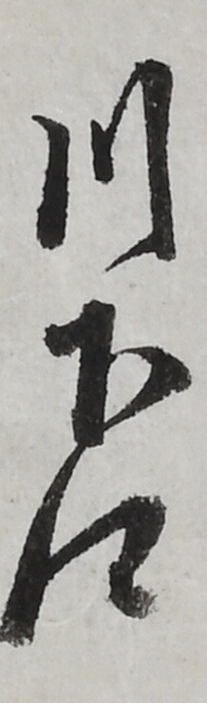川下郷
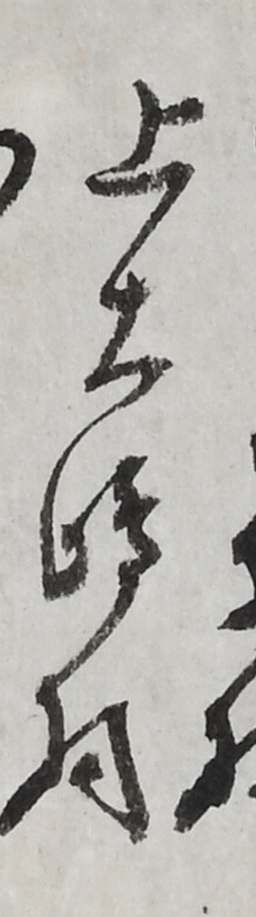上大嶋村
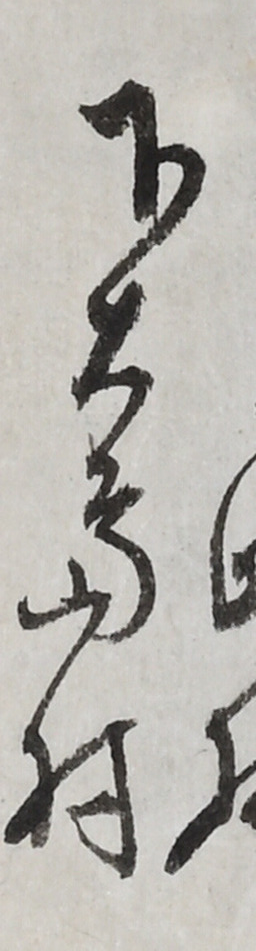下大嶋村
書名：年内行事帳
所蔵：伊那市立高遠町図書館・合同会社AMANE
